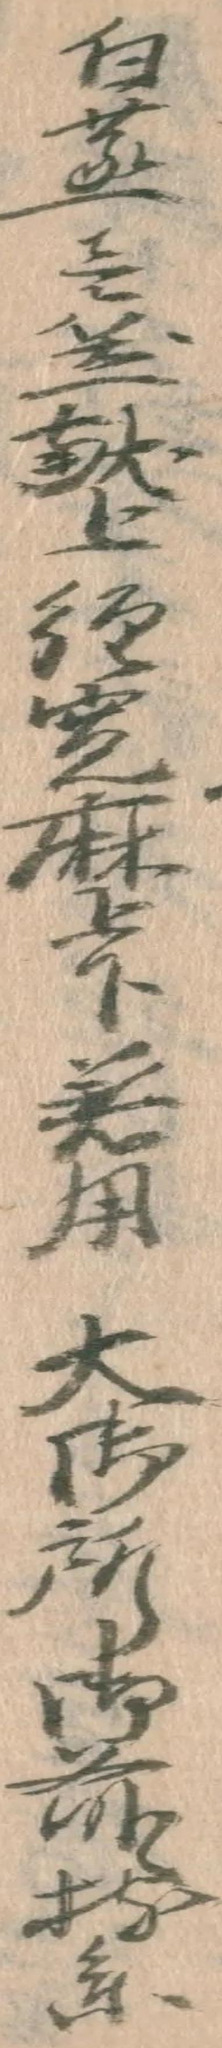白蒸壱器献上経寛麻上下着用大御所御前持参
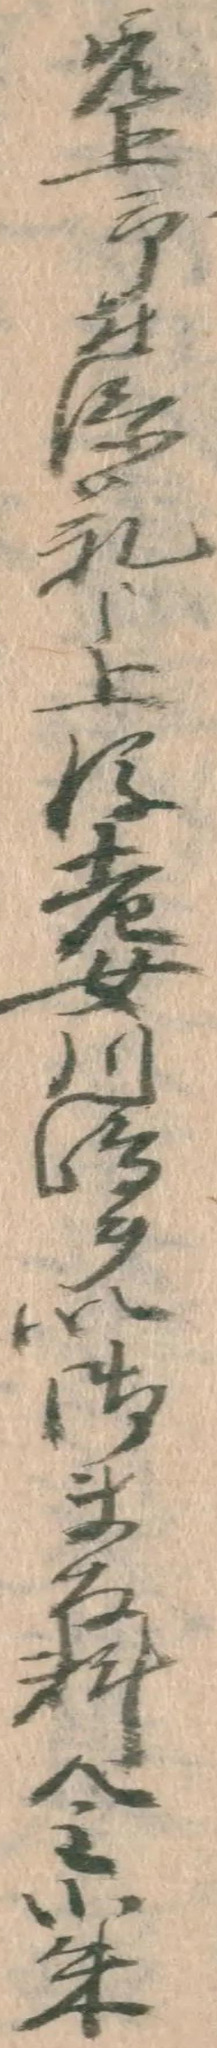差上予相添御礼申上後老女川嶋ヲ以御まな料金弐朱
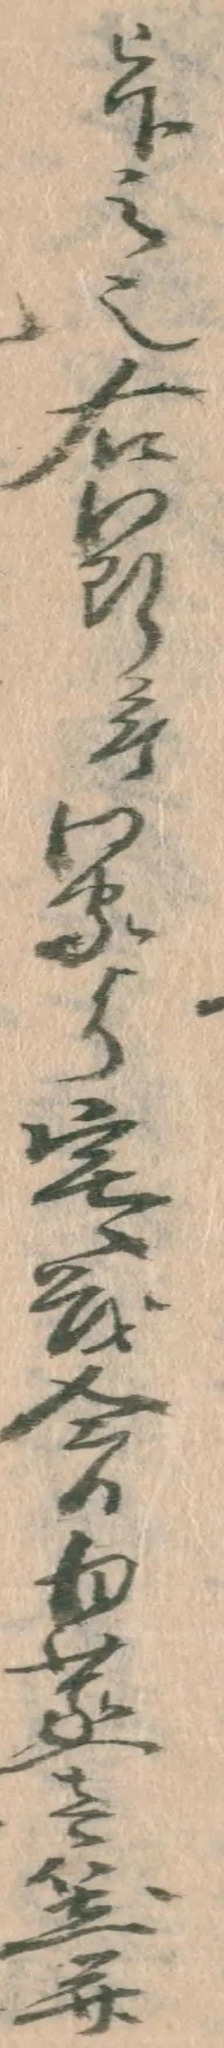被下之也右同断ニ付同家より宅へも今日白蒸壱器并
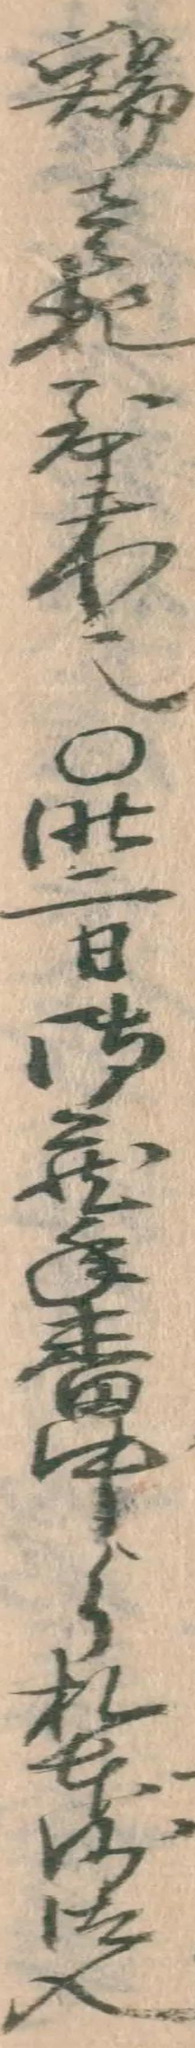鯣壱把到来也○昨二日御蔵年番中より札本沙汰人
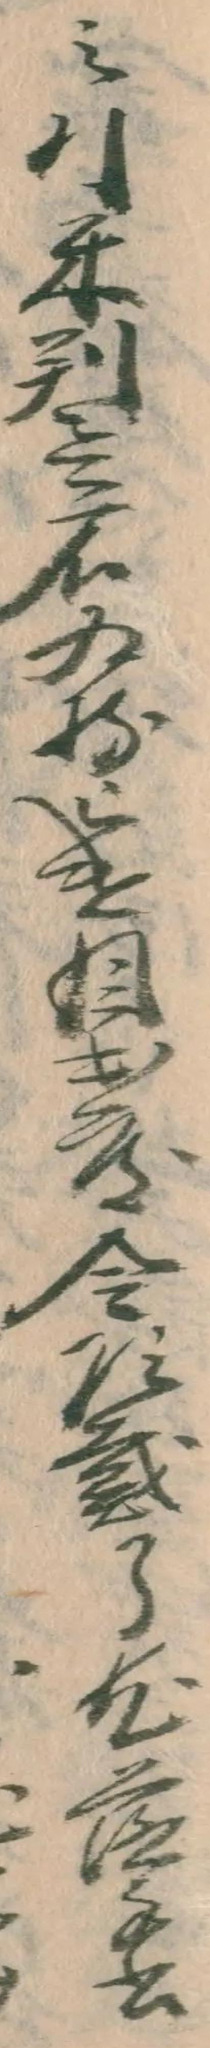之引米判壱石為持被遣目出度令頂戴了尤落手書
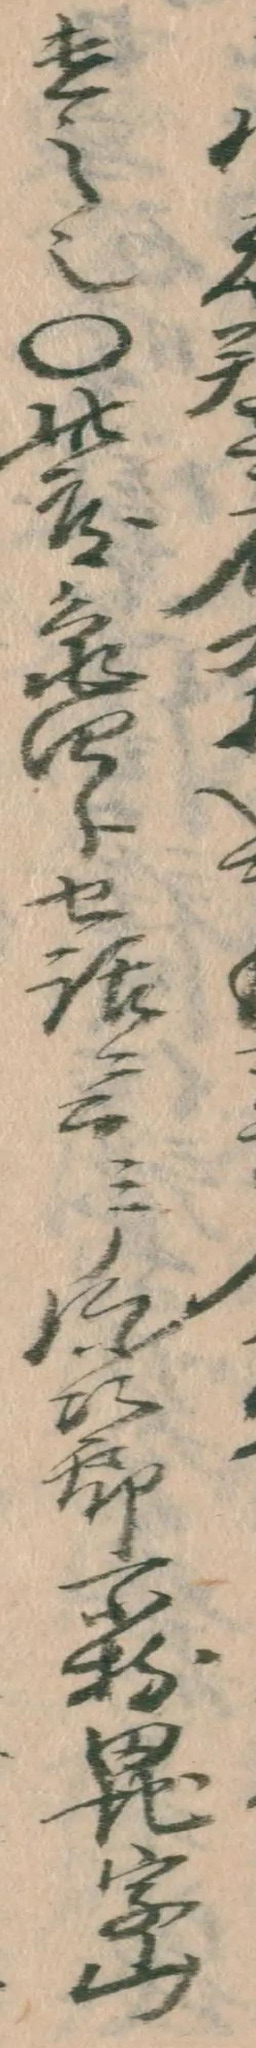遣之也○此度亀四郎世話二而三ノ弥次郎所持田地字山
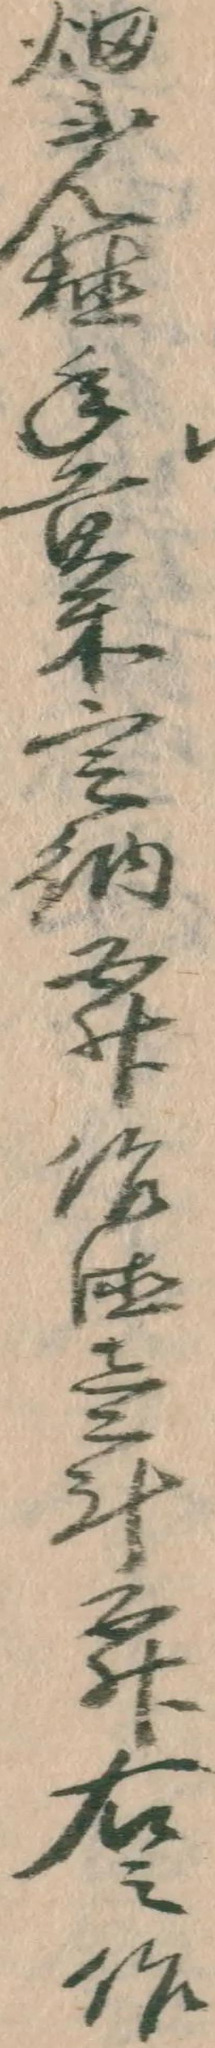畑弐人植年貢米定納五升作徳壱斗五升右之作
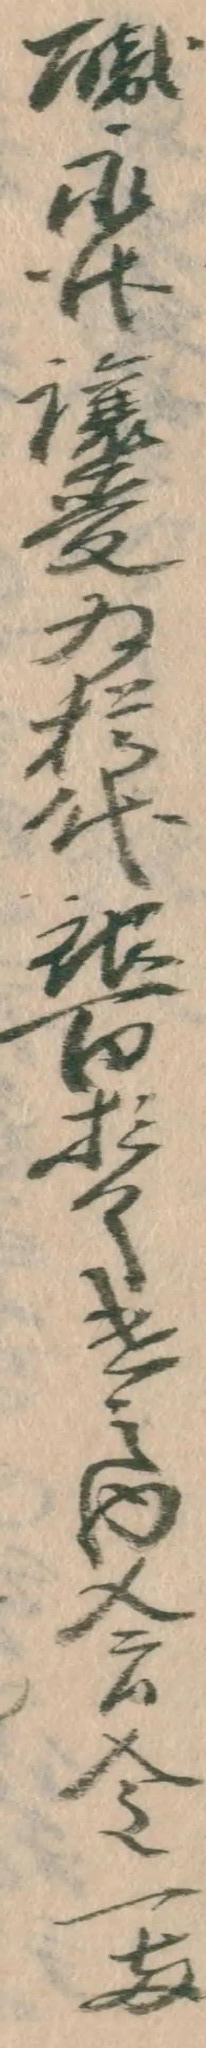職永代譲受為樽代銀百拾匁遣之内今日金一両
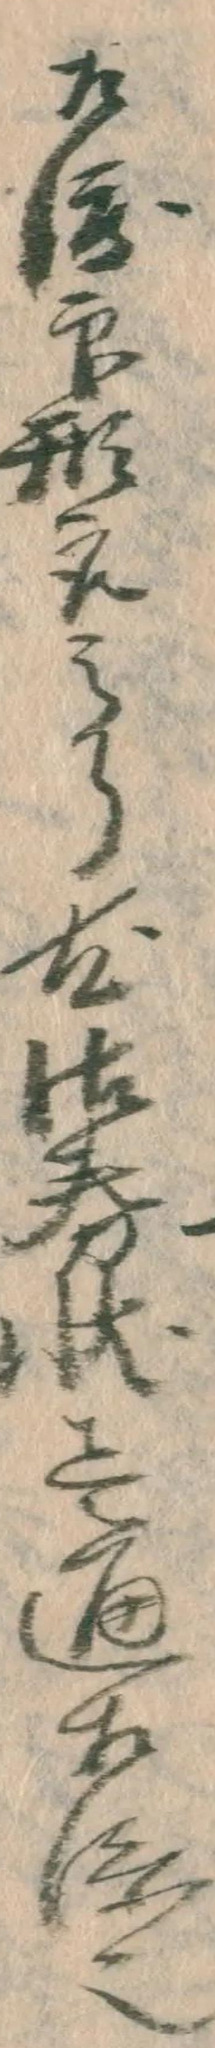相渡印形取之了御尤沽券状壱通相添也
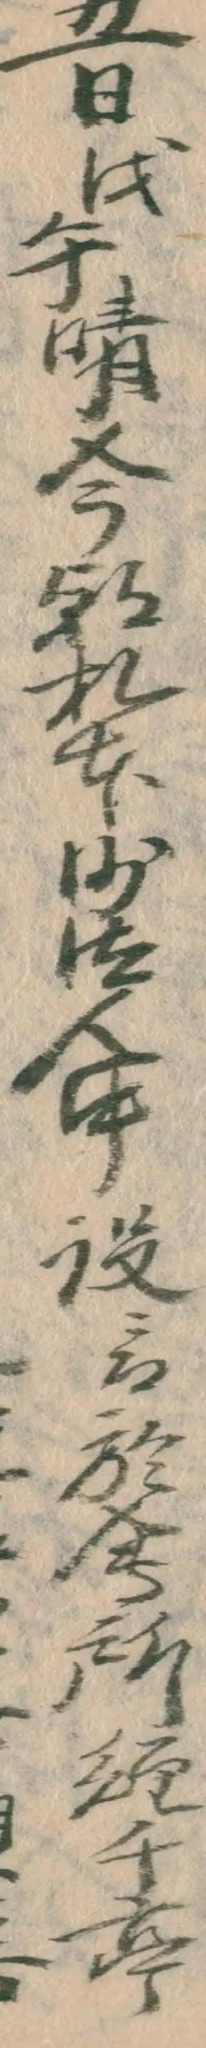五日戊午晴今朝札本沙汰人中役ニ而於會所経千亭
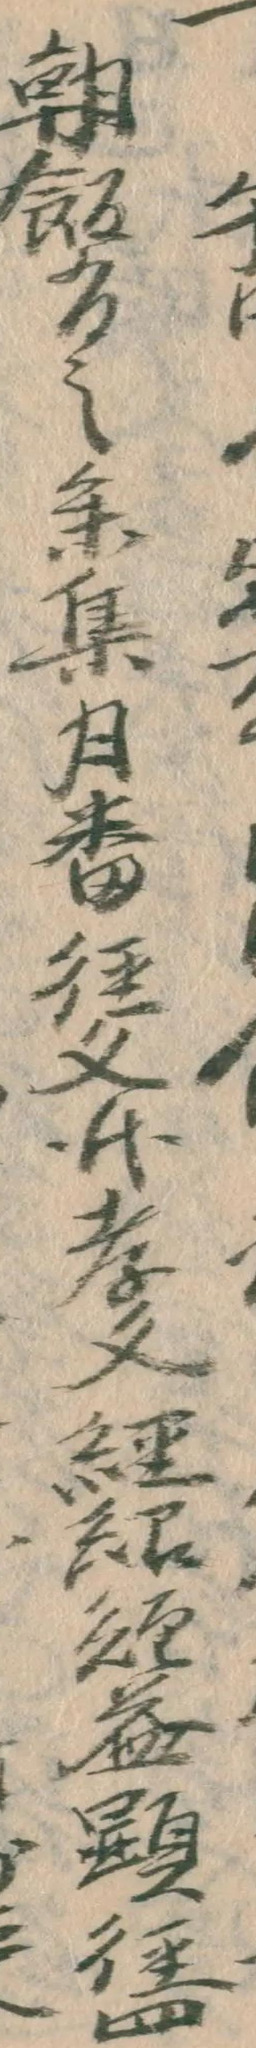朝飯有之参集月番経文代孝久経紹経益顕経四
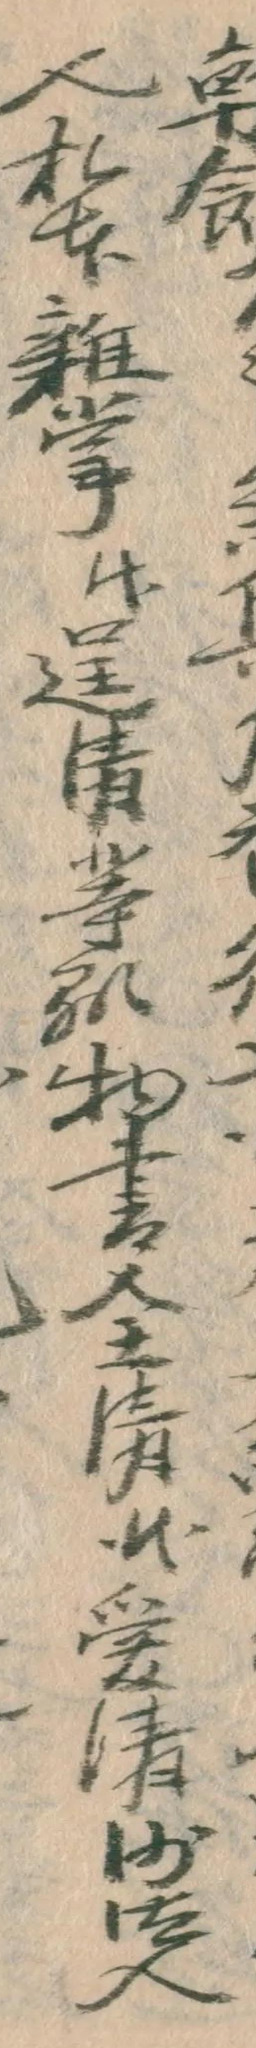人札元雑掌代逞清等顕物書全清代愛清沙汰人
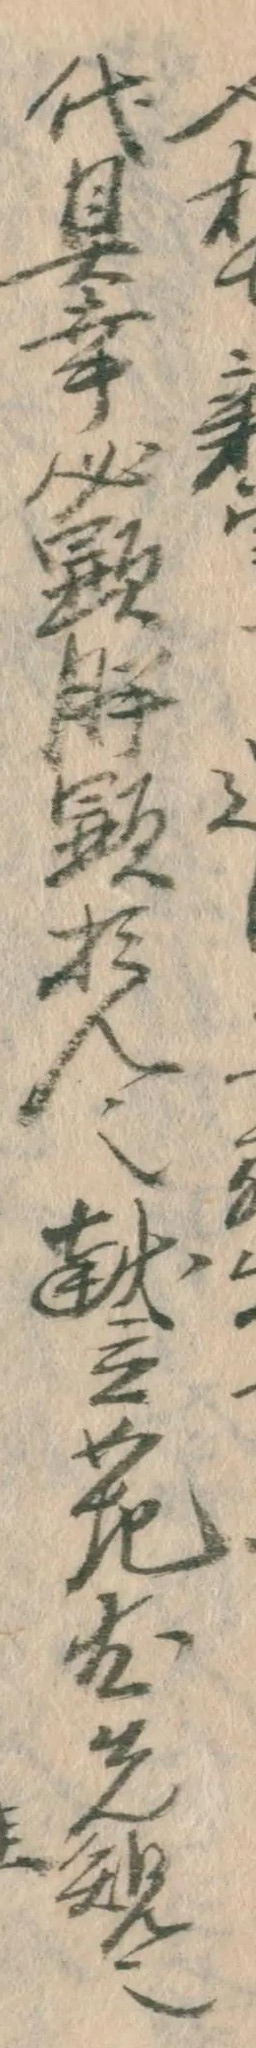代具幸必顕胖顕於人之献立如左尤先規也

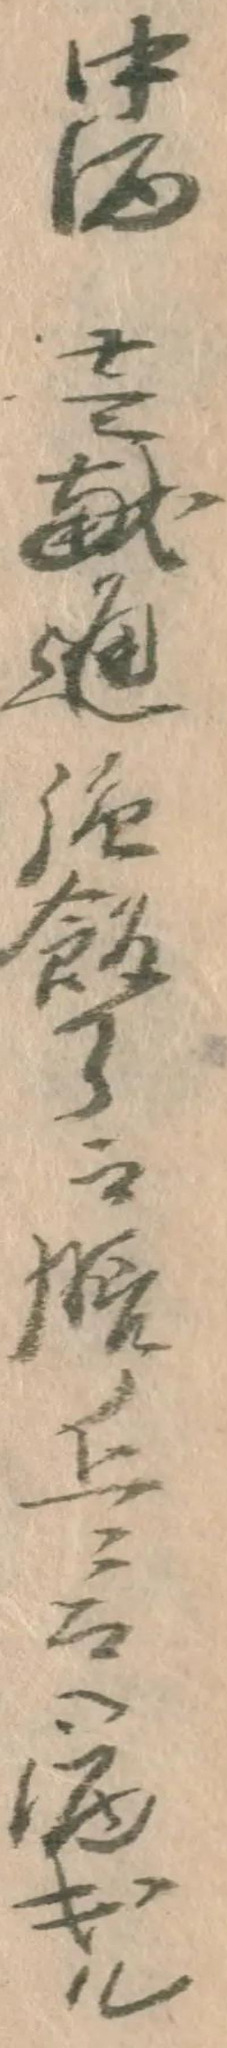中酒壱献通強飯了而膳ノ上ニ而御酒出ル
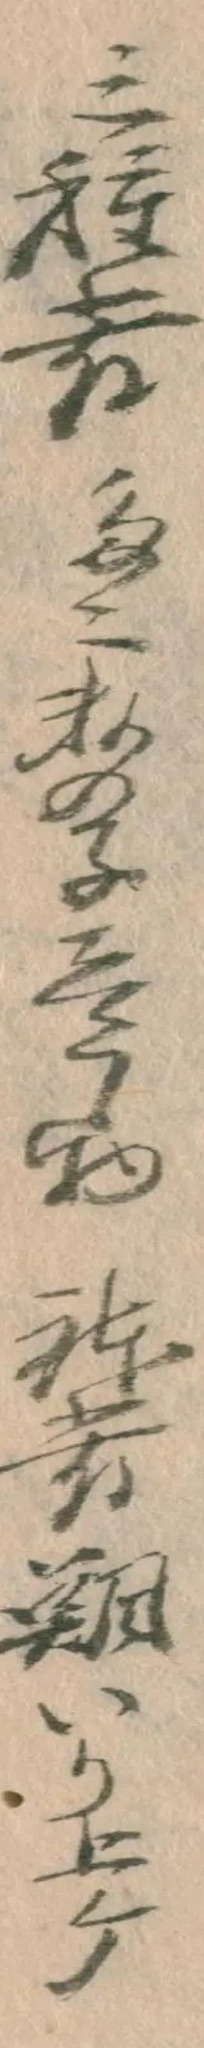三種肴たこ数の子壱う物鉢肴鯛いり上ケ
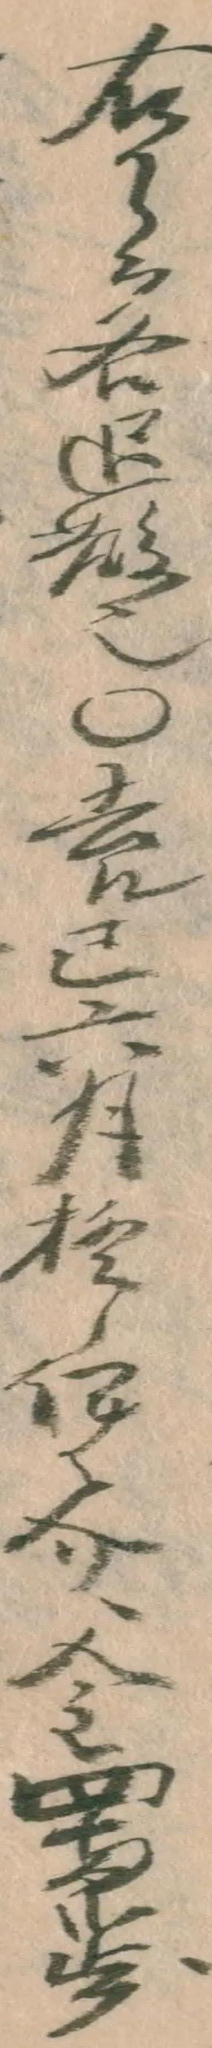右了而各退散也○去ル巳六月柊ノ伊之介へ金四両弐歩
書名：賀茂社記録. 第67冊
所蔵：国立国会図書館 National Diet Library, JAPAN
